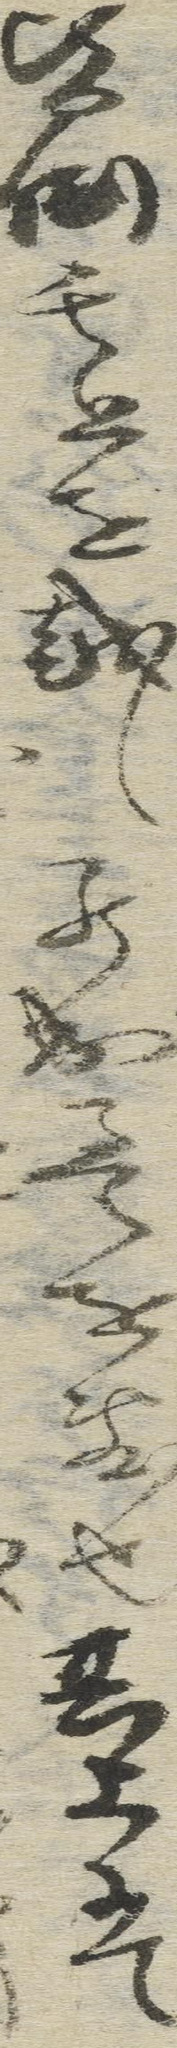皆倒其上を越し罷出畳を敷せ其上にて
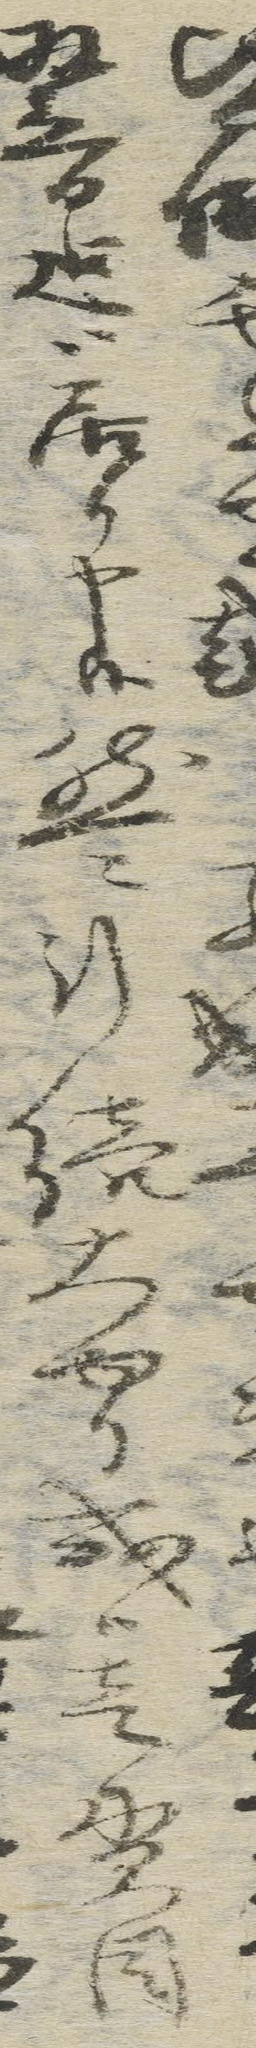翌日迄ハ居り申候然二引続大ゆり或ハ壱貫目
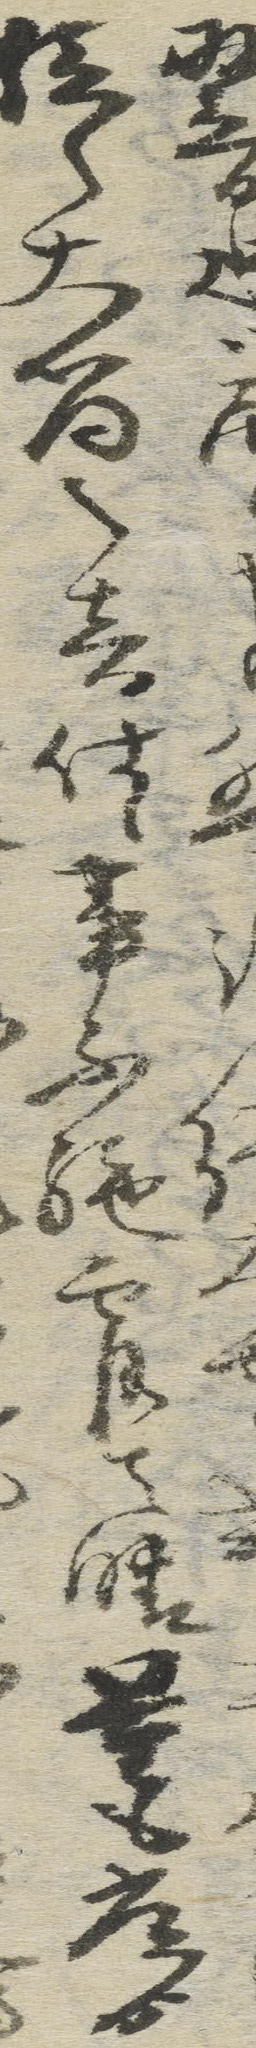位之大筒之音仕候事不絶宵は晴星も常ゟ
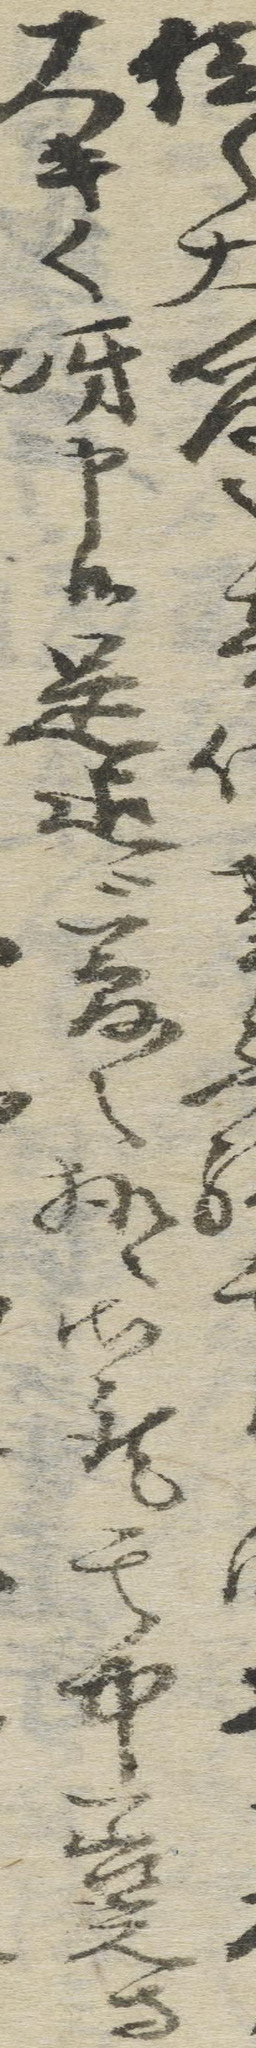大キく冴申候是迄二落候様二御座候其中善光寺
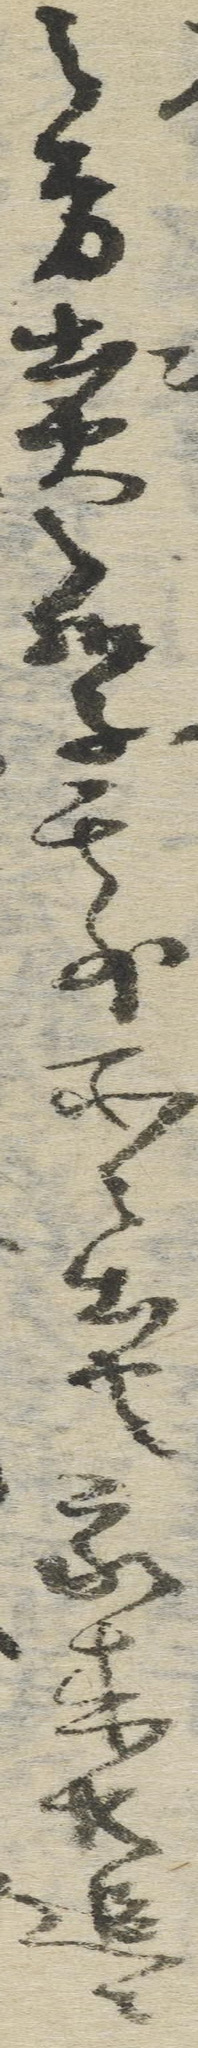之方出火之様子其外所々出火家来共追々
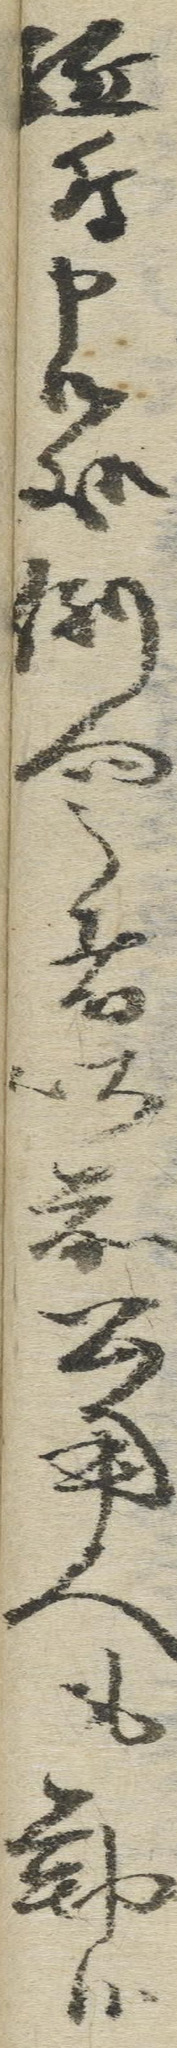駆付申候処側向之者以前公用人も勤候
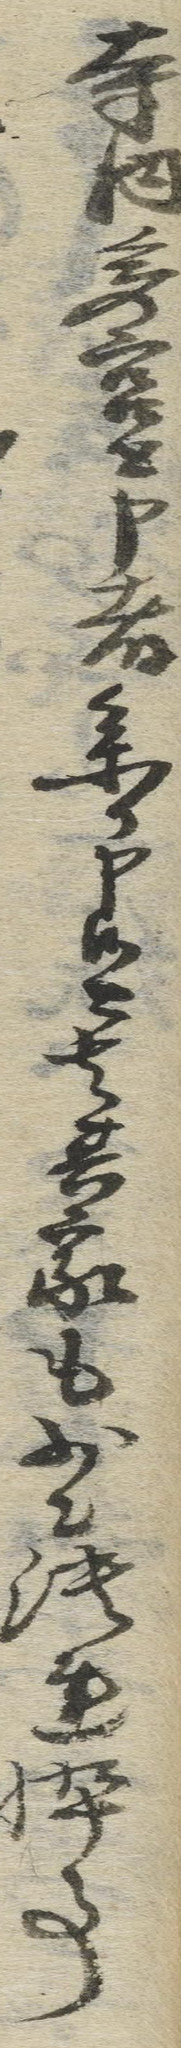寺内多宮と申者参申候二は其家も少々潰れ忰事
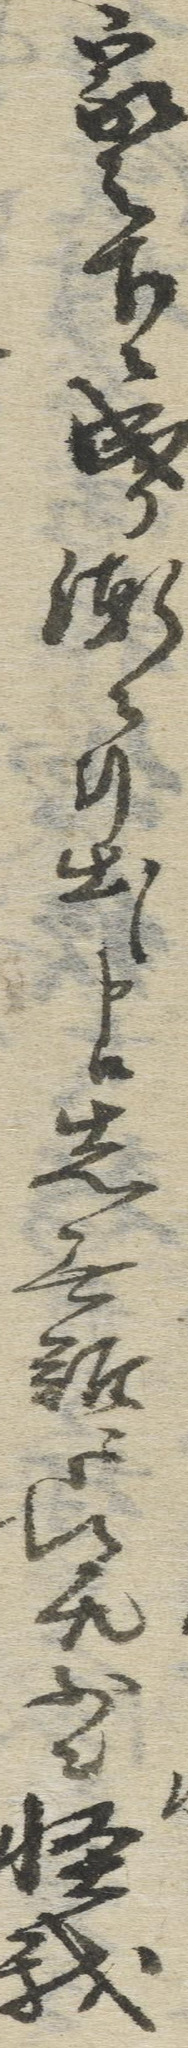家之下二成り漸々引出し申候先無難二御座候得共少々怪我
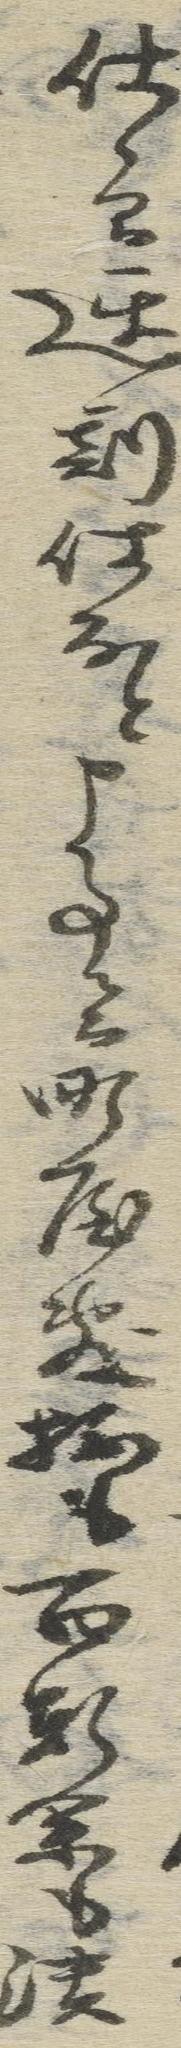仕候間遅刻仕候と申事二而町屋敷抔も百軒余も潰
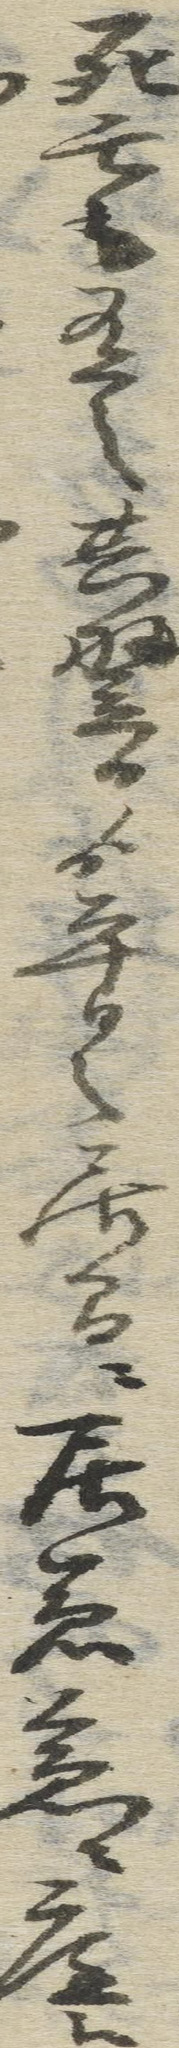死亡も有之其翌日ゟ平日之居間二居兼急二庭江
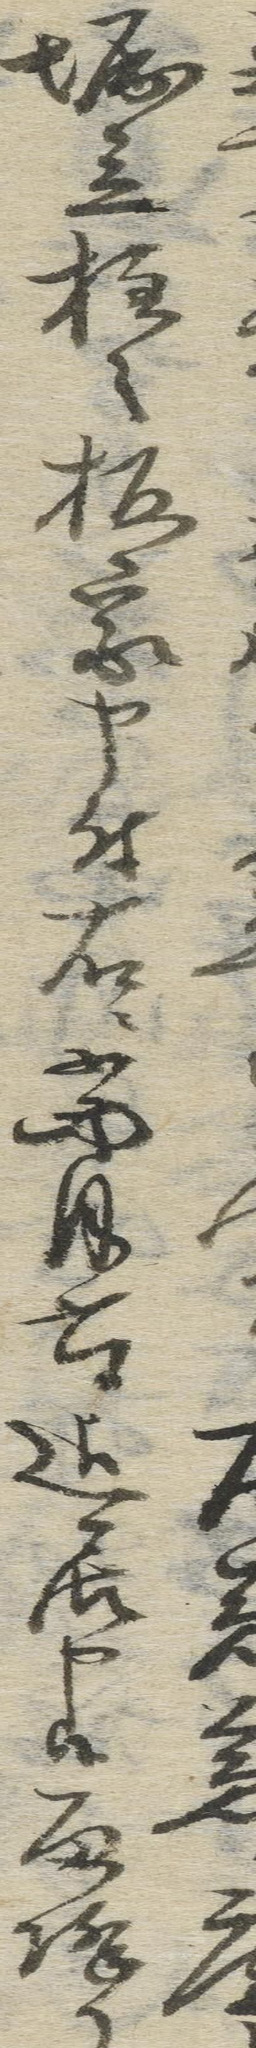堀立柱之板家申付右二当月六日迄居申候雨降り
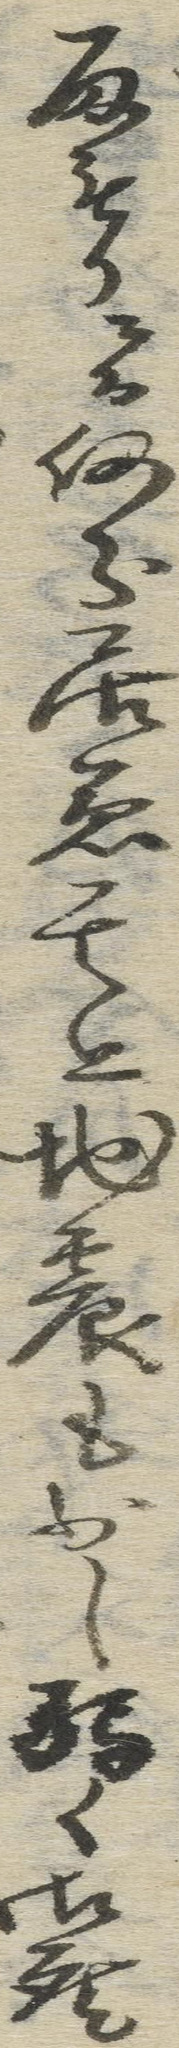雨もり二而何分居兼其上地震も少し弱く御座候
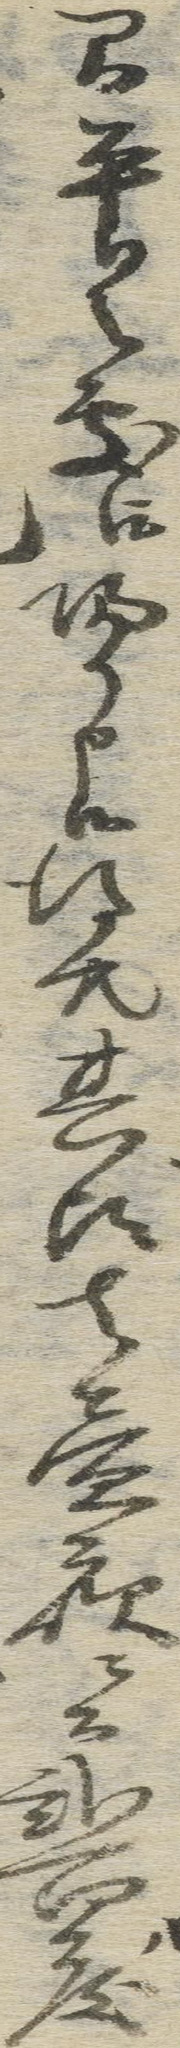間平日之処江帰申候得共其頃は昼夜二而弐百度
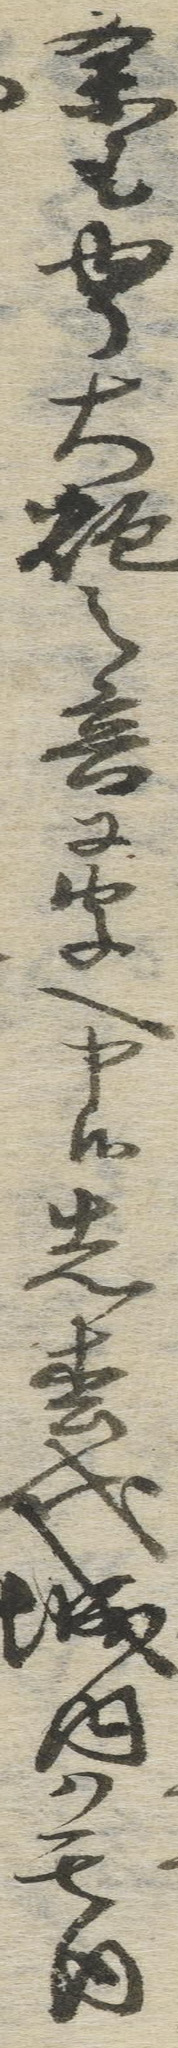余もゆり大炮之音に聞へ申候先枩代城内の其内
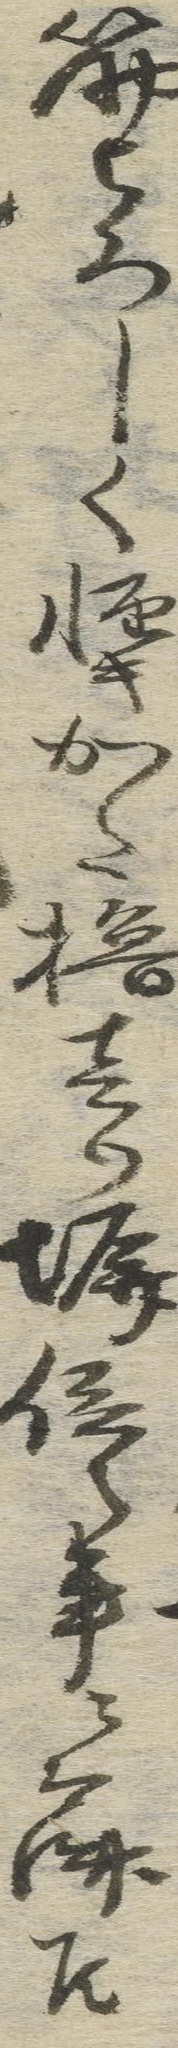筋よろしく軽キかた櫓台之塀位之事二而済候
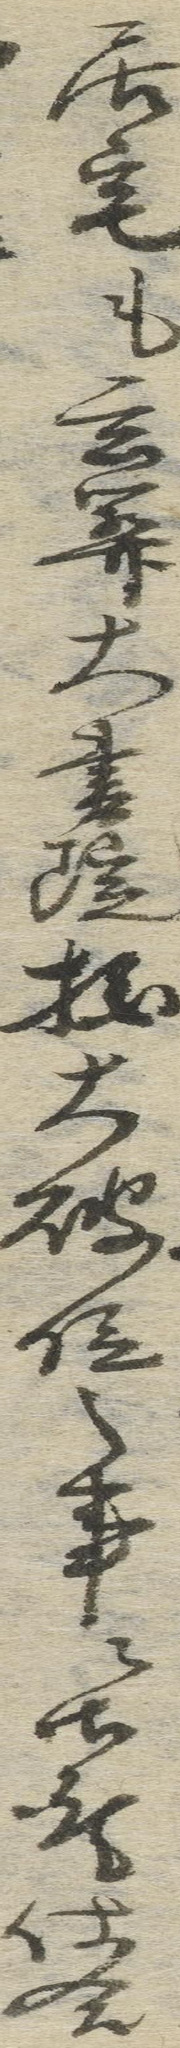居宅も玄関大書院抔大破位之事二御座候仕合
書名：信濃越後　地震書留
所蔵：東京大学地震研究所図書室 Earthquake Research Institute Library, The University of Tokyo, JAPAN
